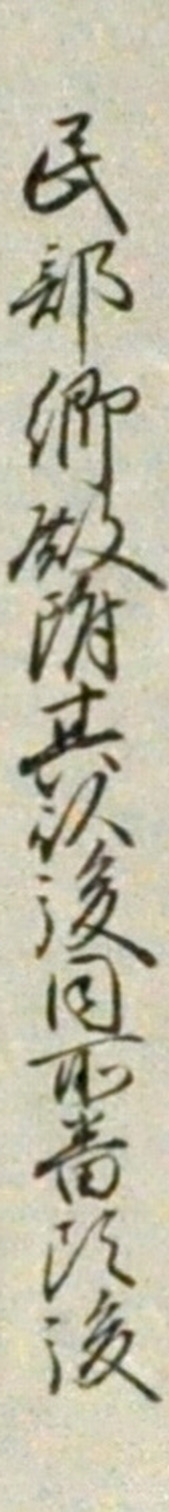民部卿殿附其以後同所番頭後
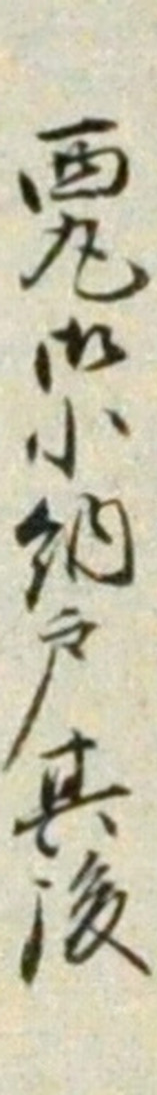西丸御小納戸其後
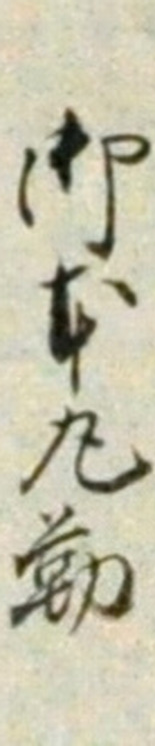御本丸勤
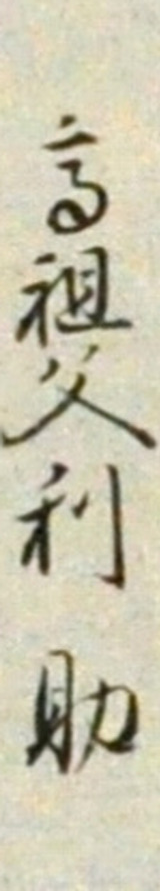高祖父利助
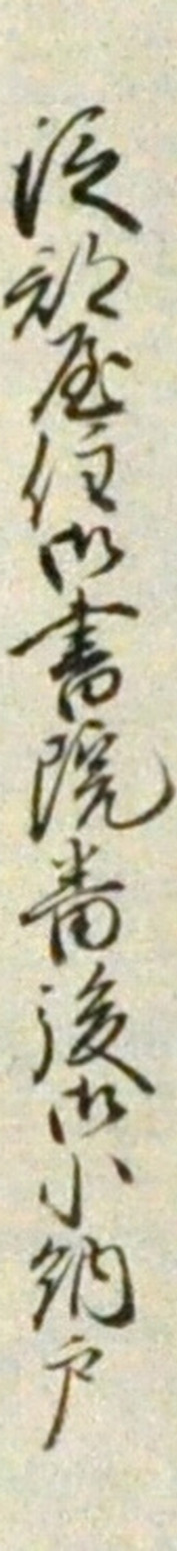従部屋住御書院番後御小納戸
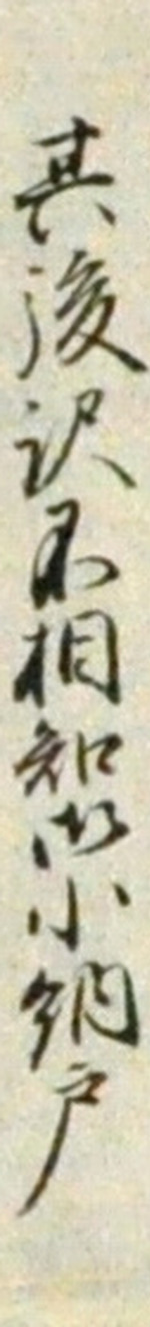其後訳不相知御小納戸
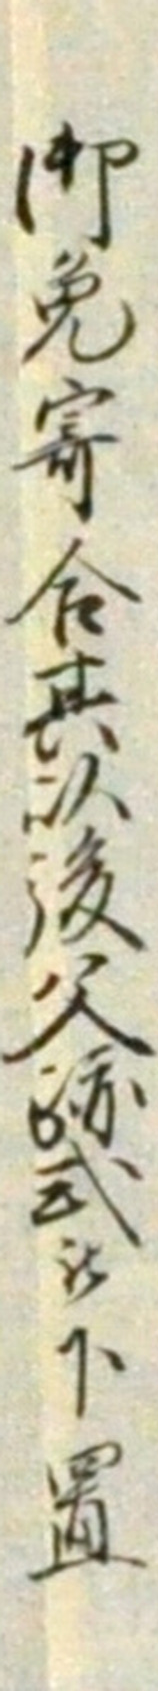御免寄合其以後父跡式被下置
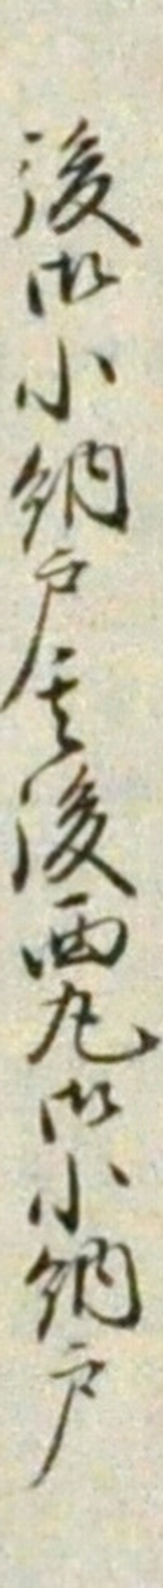後御小納戸其後西丸御小納戸
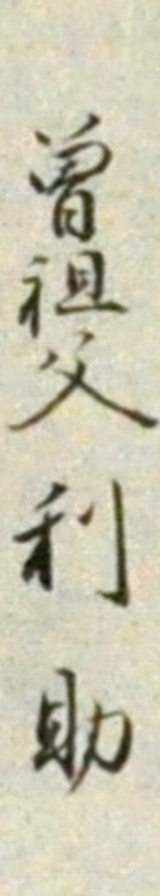曽祖父利助
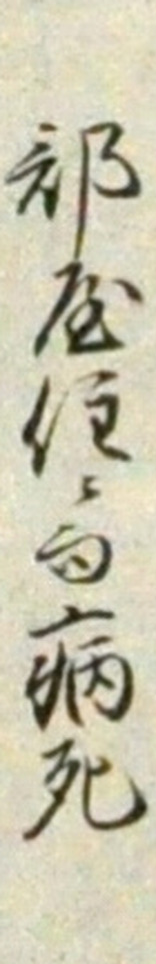部屋住ニ而病死
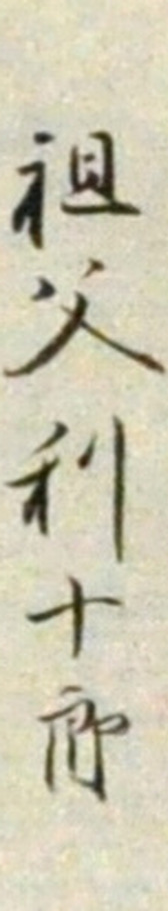祖父利十郎
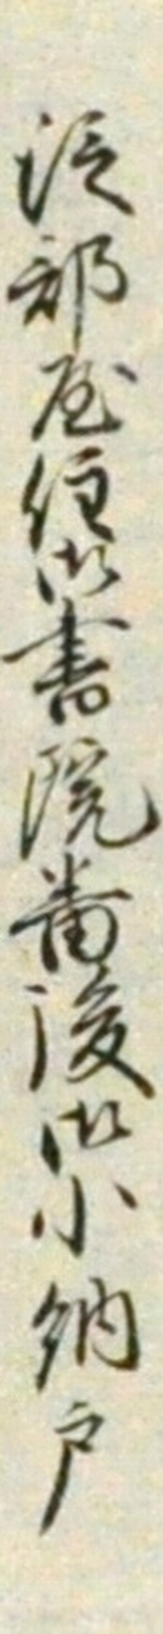従部屋住御書院番後御小納戸
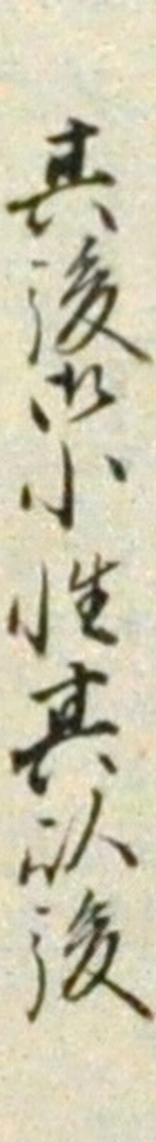其後御小姓其以後
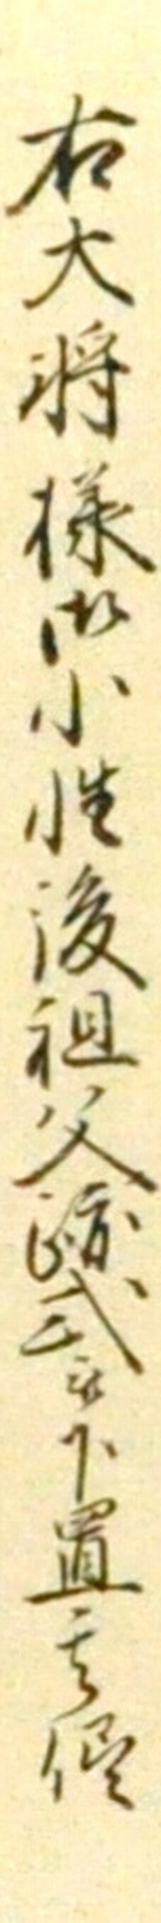右大将様御小姓後祖父跡式被下置其侭
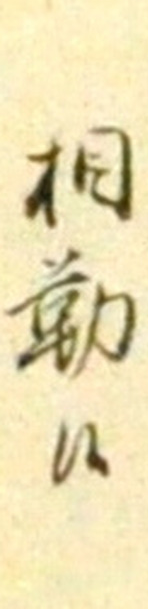相勤候
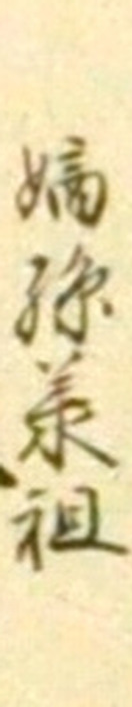嫡孫承祖
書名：若年寄御役中御調書付
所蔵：伊那市立高遠町図書館・合同会社AMANE
